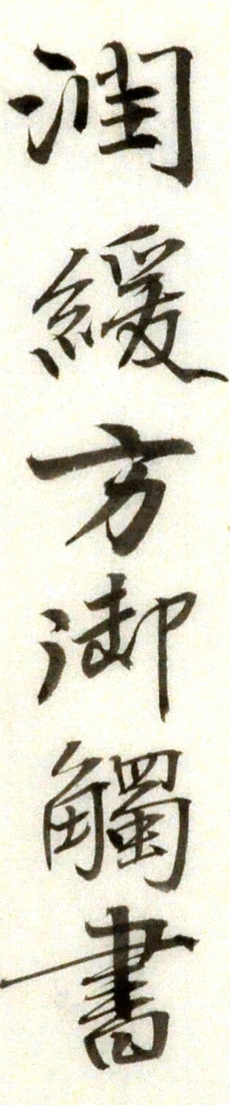潤緩方御触書

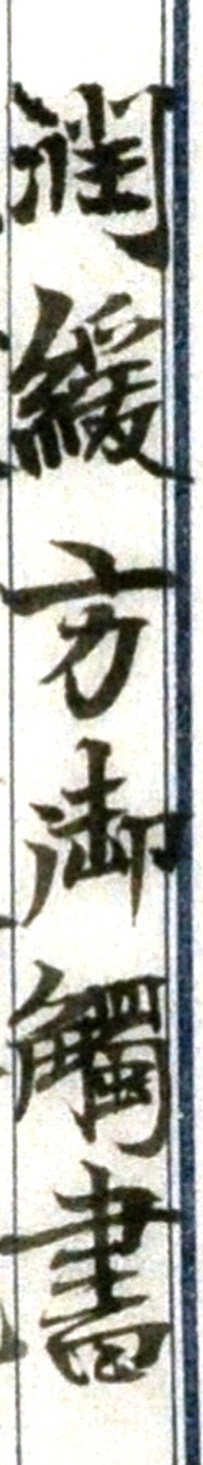潤緩方御触書
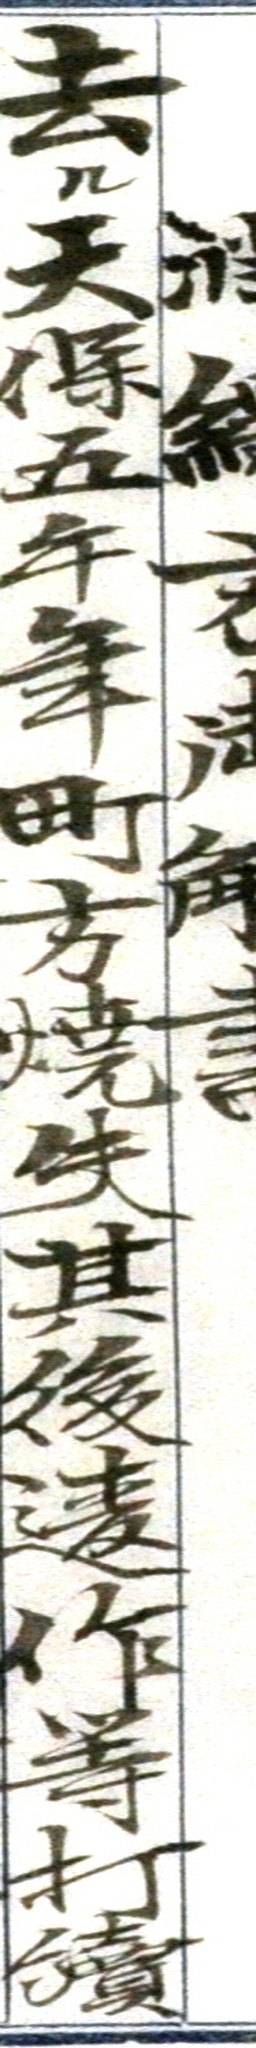去ル天保五午年町方焼失其後違作等打続
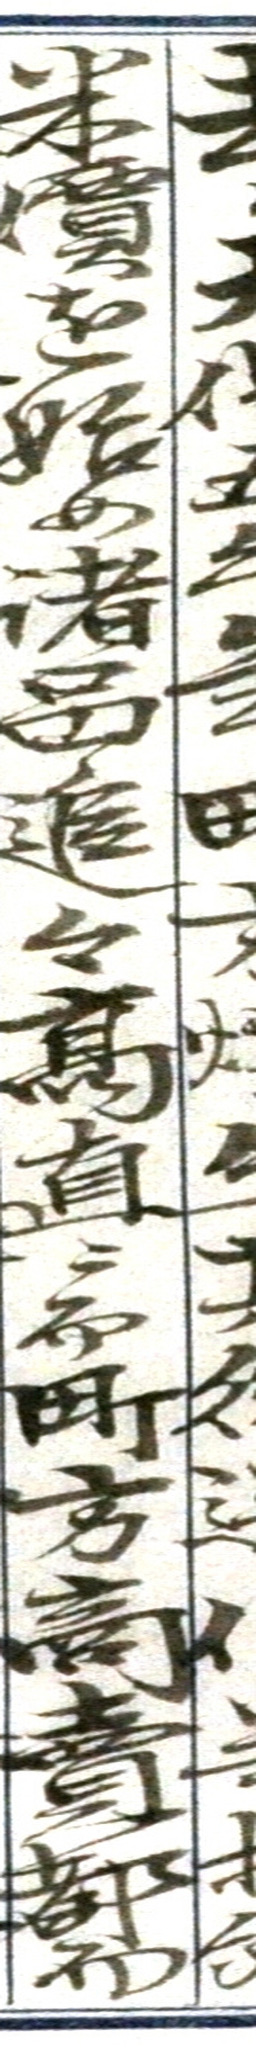米価を始め諸品追々高直ニ而町方商売都而
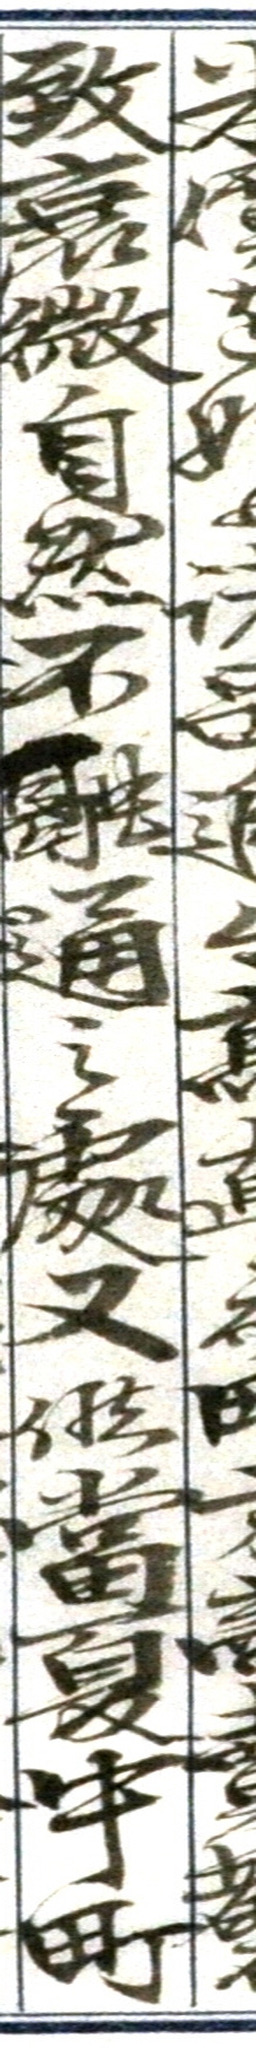致衰微自然不融通之処又候当夏中町
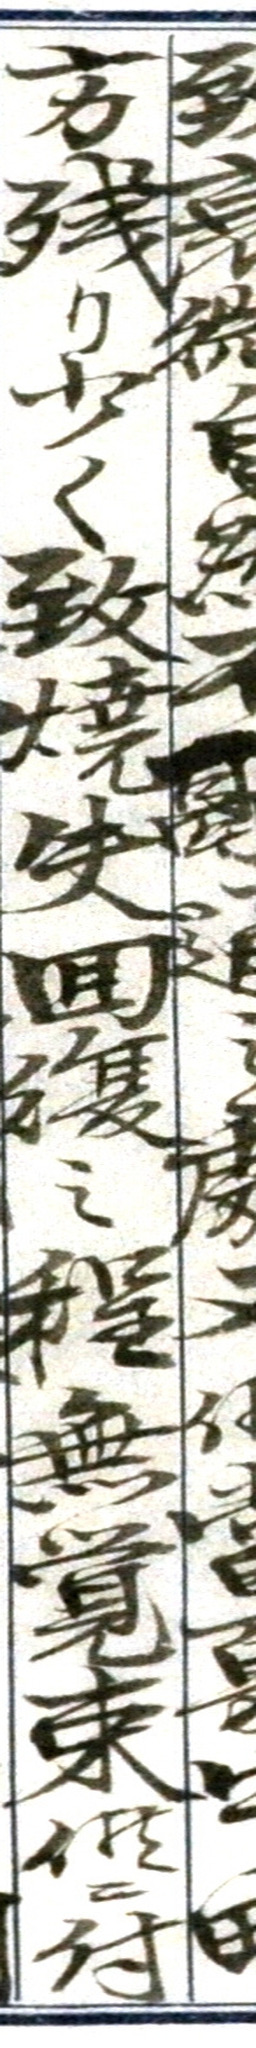方残り少く致焼失回復之程無覚束候ニ付
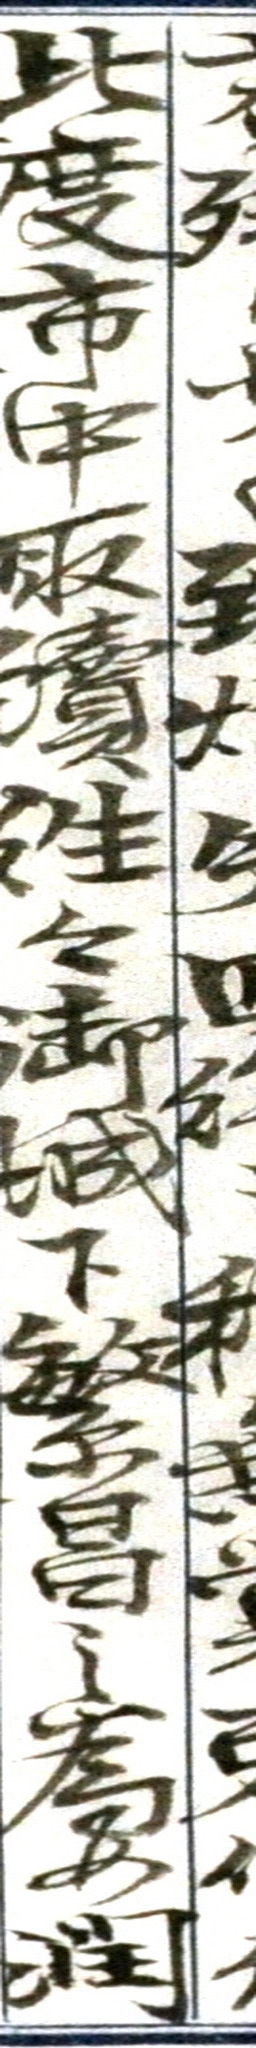此度市中取続往々御城下繁昌之為め潤
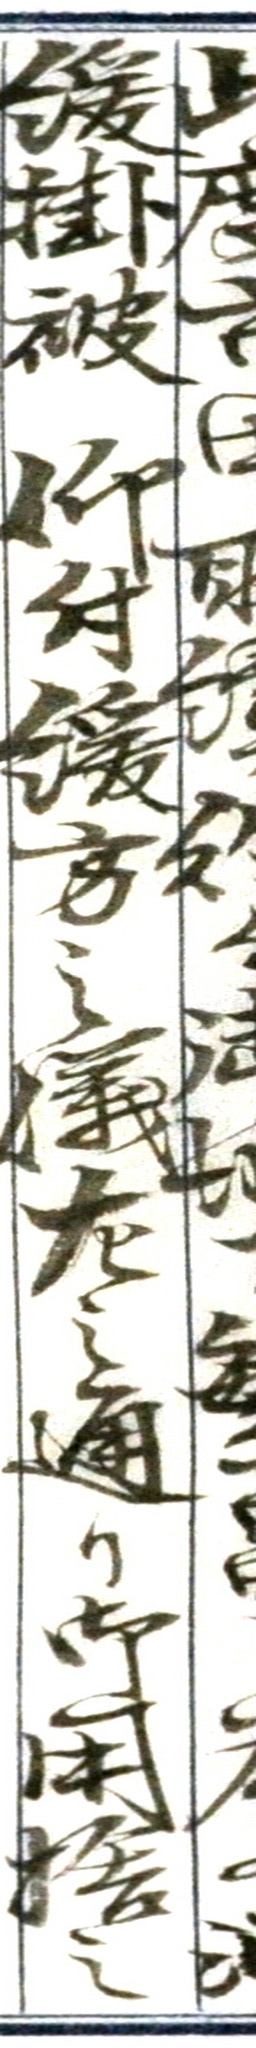緩掛被仰付緩方之儀左之通り御用捨之
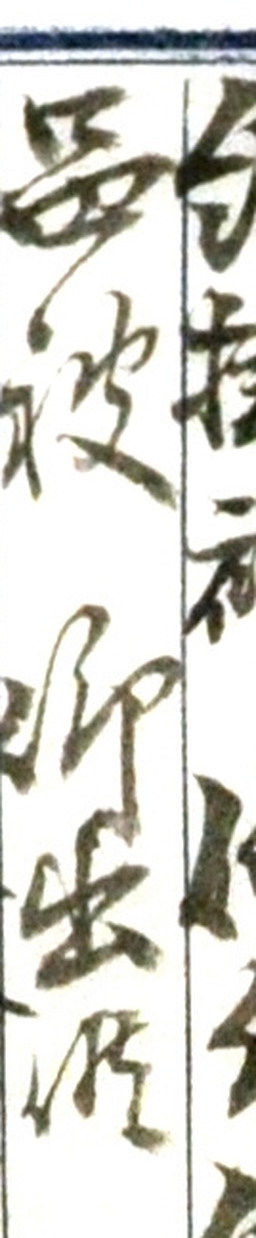品被仰出候
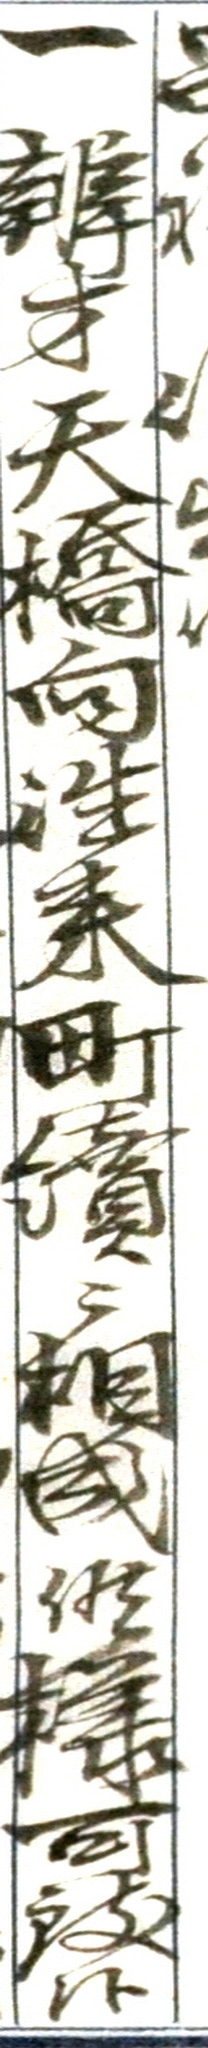一弁才天橋向往来町続ニ相成候様可致候
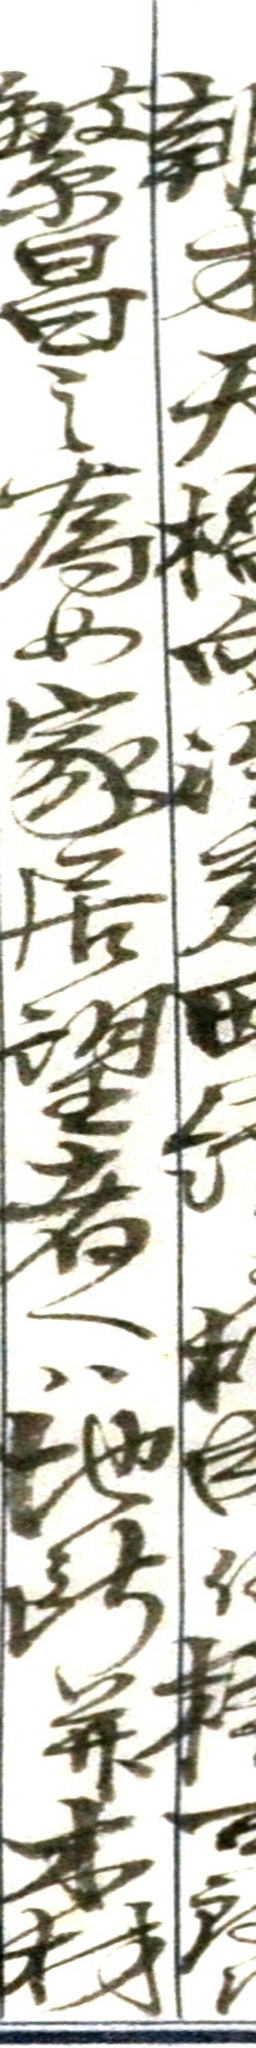繁昌之為め家居望者へは地所幷木材
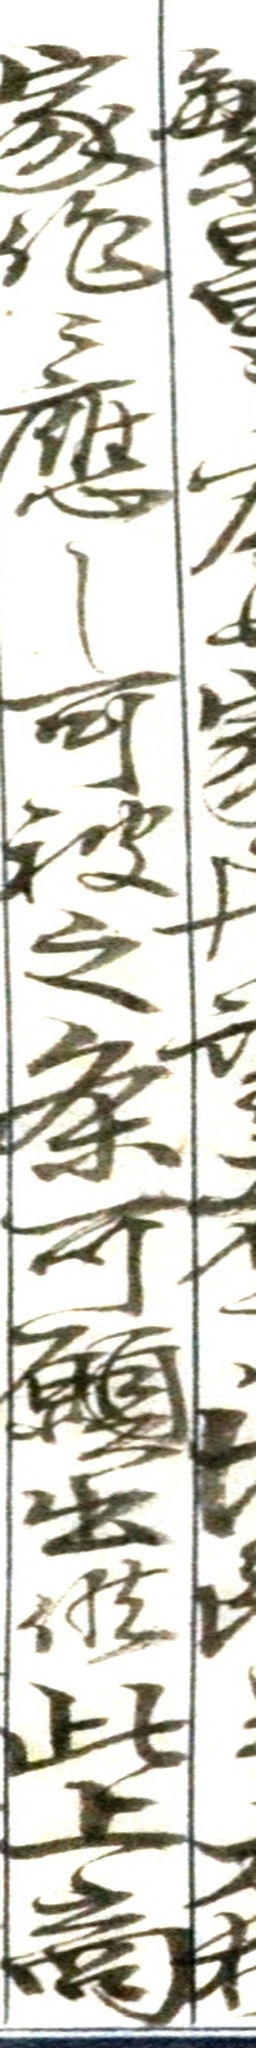家作ニ応し可被之条可願出候此上商
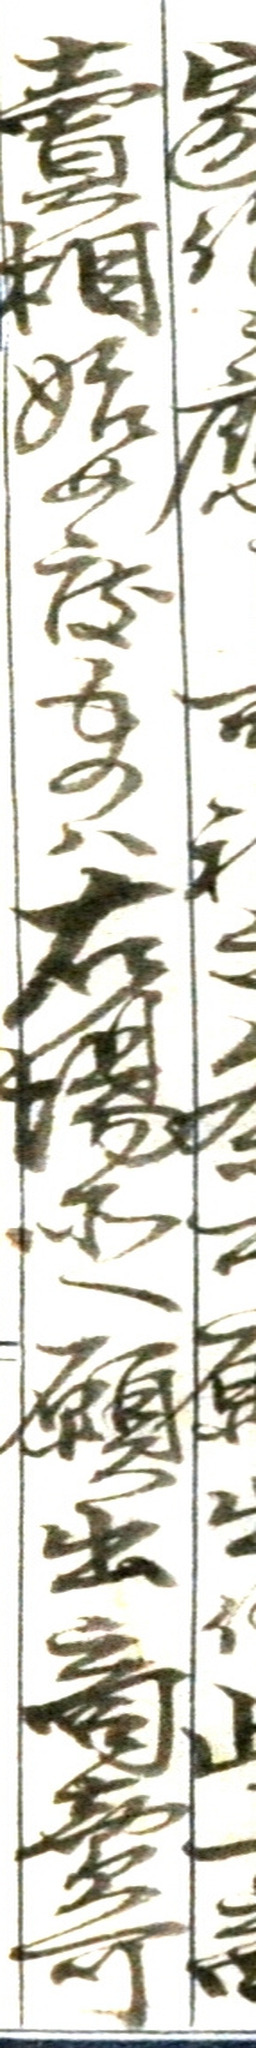売相始め度ものは右場所へ願出商売可

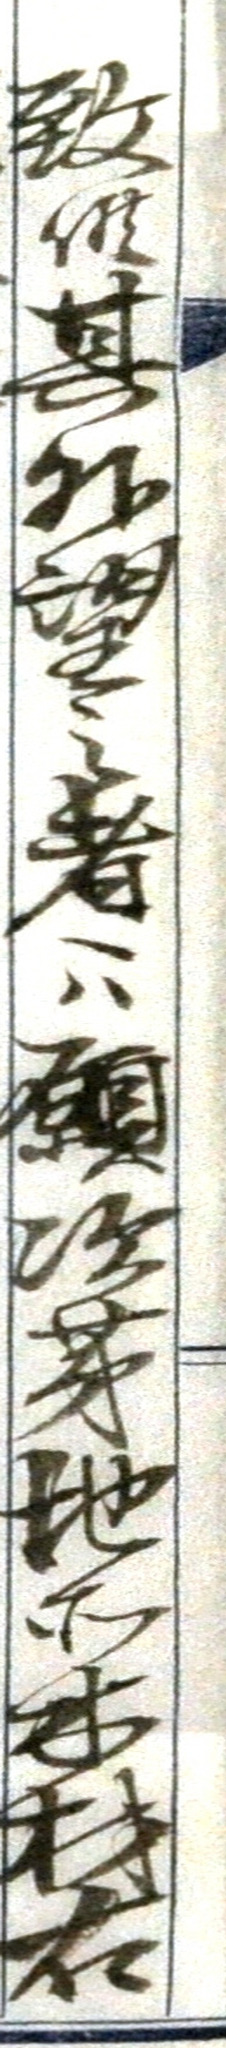致候其外望之者へは願次第地所木材等右
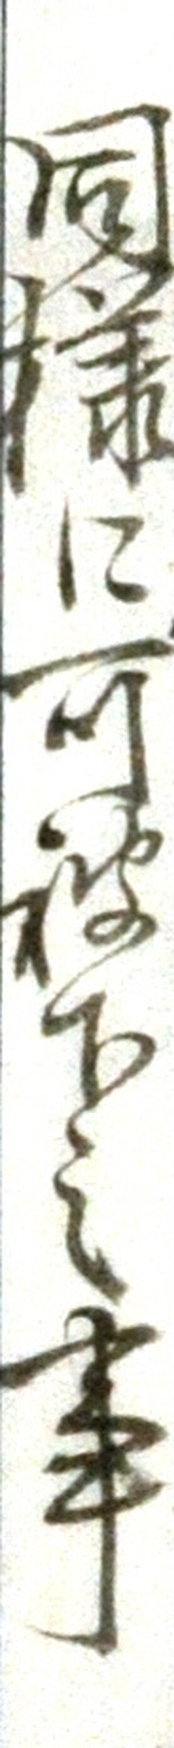同様に可被下之事
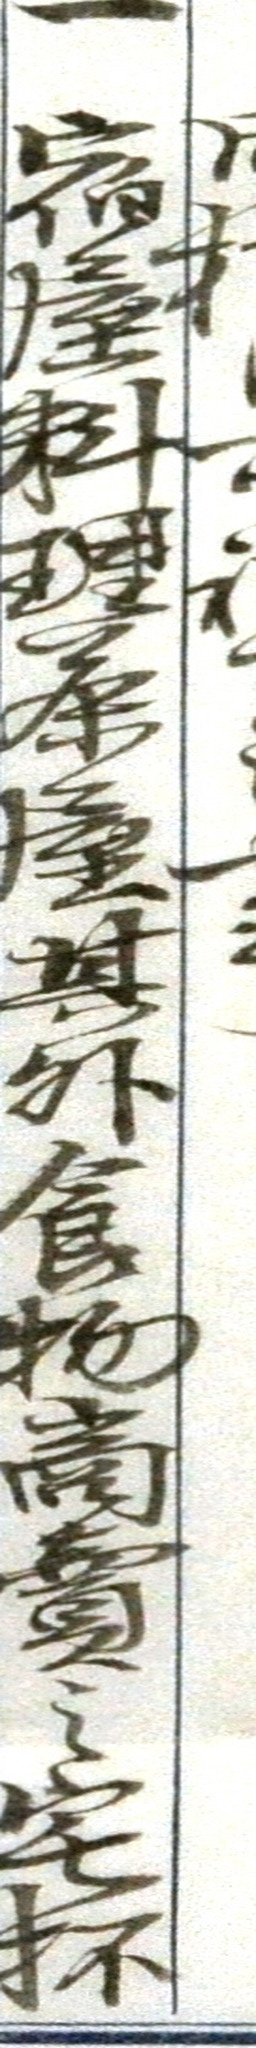一宿屋料理茶屋其外食物商売之宅抔
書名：潤緩方御触書
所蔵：伊那市立高遠町図書館・合同会社AMANE
